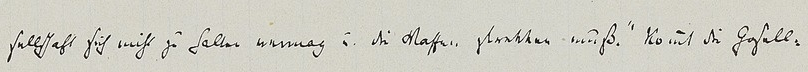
sellschaft sich nicht zu halten vermag u. die Waffen strekken muß.» Kommt die Gesell-
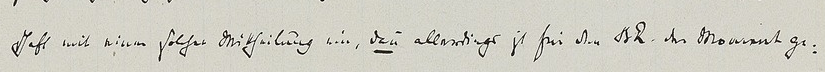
schaft mit einer solchen Mittheilung ein, dann allerdings ist für den BR. der Moment ge-
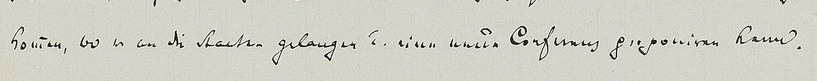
kommen, wo er an die Staaten gelangen u. eine neue Conferenz proponiren kann.
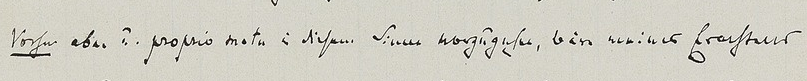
Vorher aber u. proprio motu in diesem Sinne vorzugehen, wäre meines Erachtens
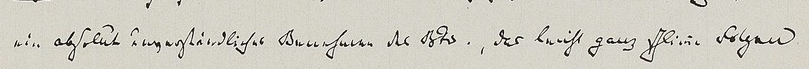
ein absolut unverständliches Benehmen des BRs., das leicht ganz schlimme Folgen
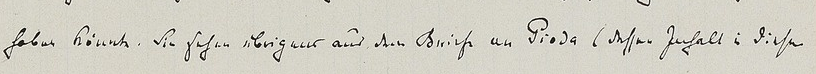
haben könnte. Sie sehen übrigens aus dem Briefe an Pioda (dessen Inhalt in dieser
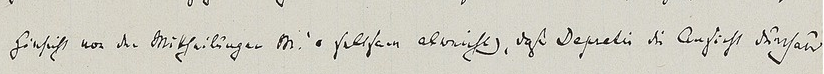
Hinsicht von den Mittheilungen M.'s seltsam abweicht), daß Depretis die Ansicht durchaus
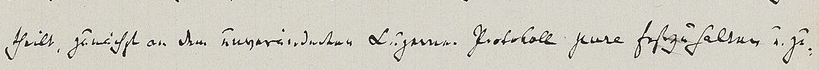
theilt, zunächst an dem unveränderten Luzerner Protokoll pure festzuhalten u. zu-
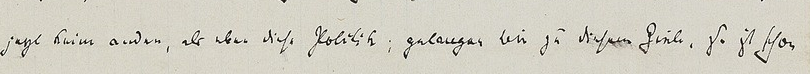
jetzt keine andere, als eben diese Politik; gelangen wir zu diesem Ziele, so ist schon
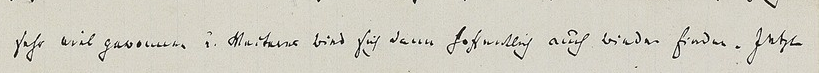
sehr viel gewonnen u. Weiteres wird sich dann hoffentlich auch wieder finden. Jetzt
